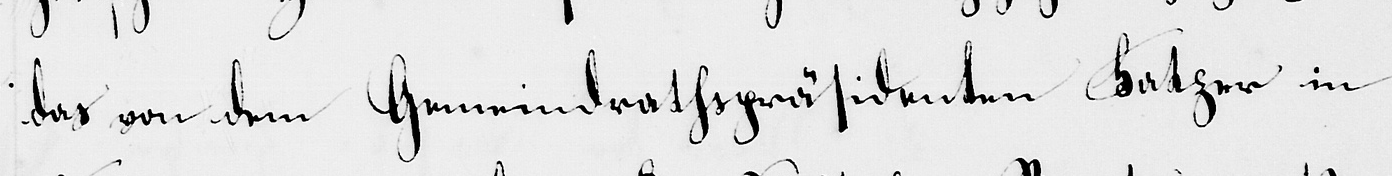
das von dem Gemeindrathspräsidenten Fatzer in
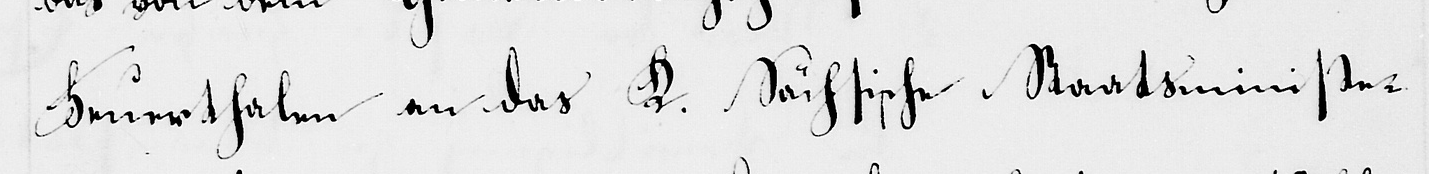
Feuerthalen an das K. Sächsische Staatsministe¬
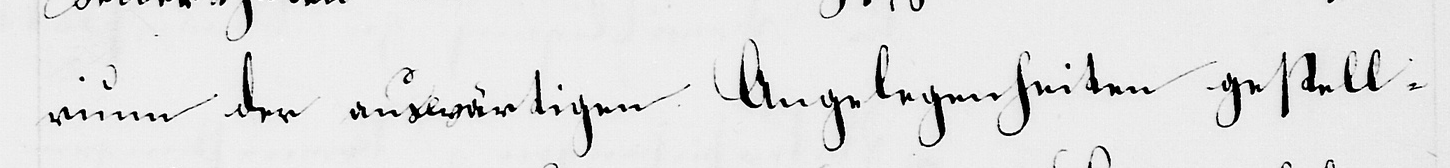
rium der auswärtigen Angelegenheiten gestell¬
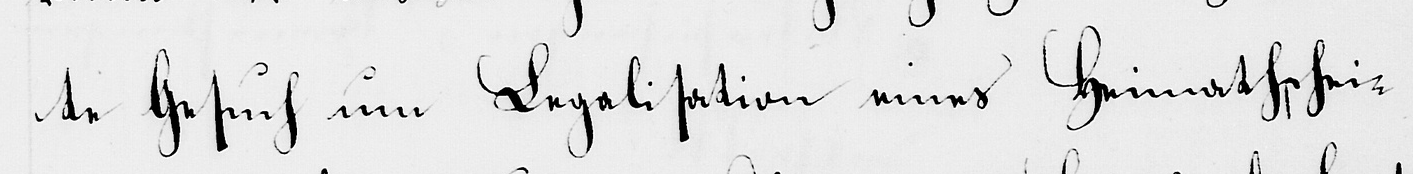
te Gesuch um Legalisation eines Heimathschei¬
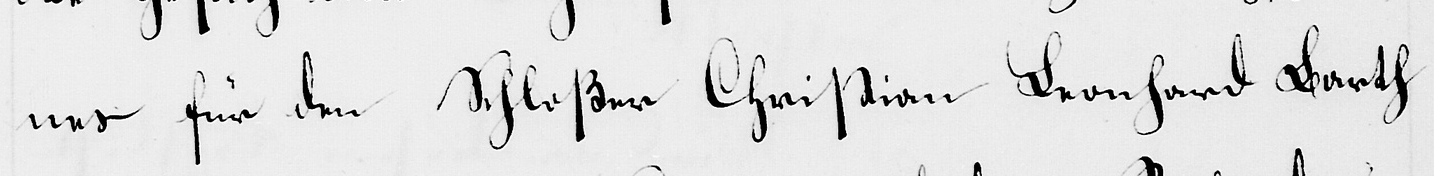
nes für den Schloßer Christian Leonhard Barth
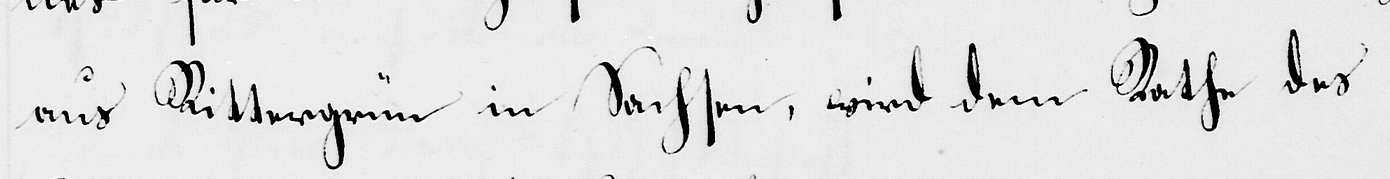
aus Rittergrün in Sachsen, wird dem Rathe des
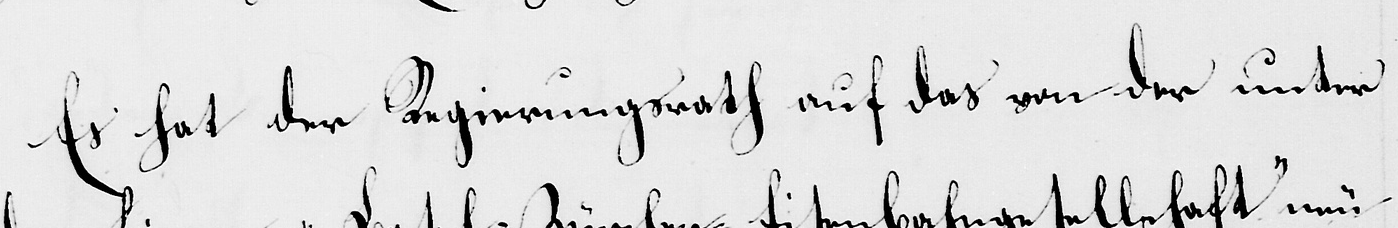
Es hat der Regierungsrath auf das von der unter
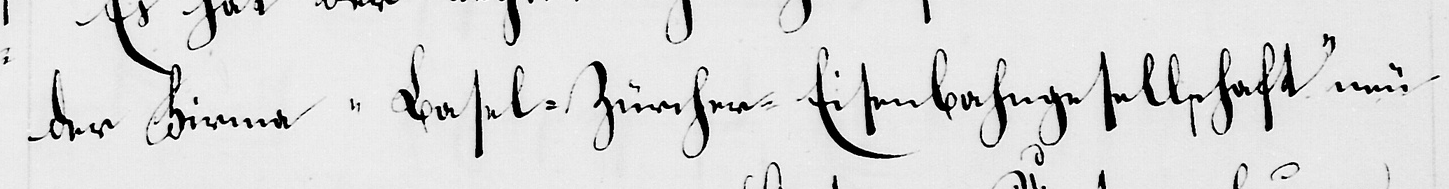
der Firma „Basel-Zürcher-Eisenbahngesellschaft“ neu¬
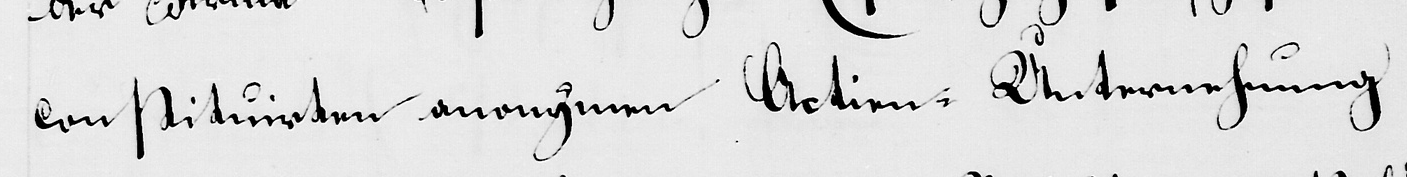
constituirten anonymen Actien-Unternehmung
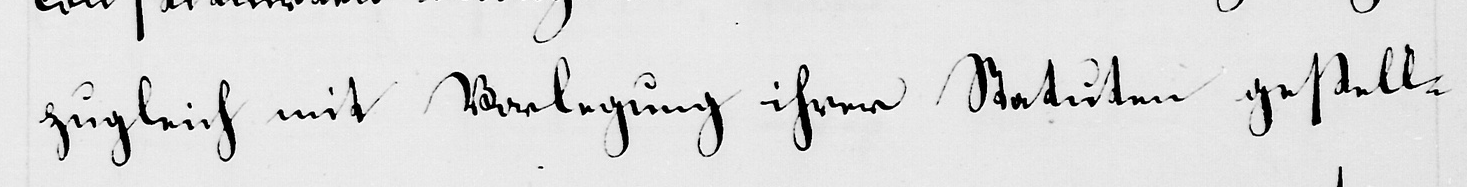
zugleich mit Verlegung ihrer Statuten gestell-
